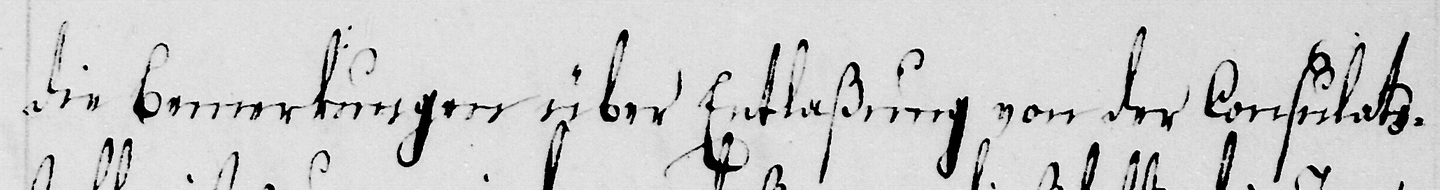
die Bemerkungen über Entlaßung von der Consulats¬
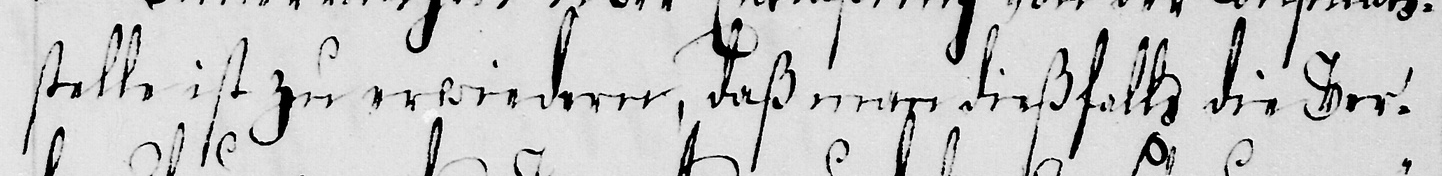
stelle ist zu erwiedern, daß man dießfalls die Ver¬
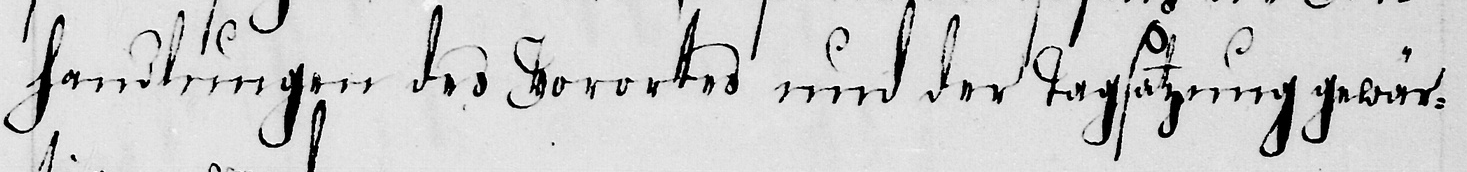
handlungen des Vorortes und der Tagsatzung gewär¬
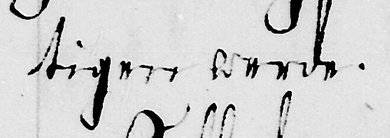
tigen werde.
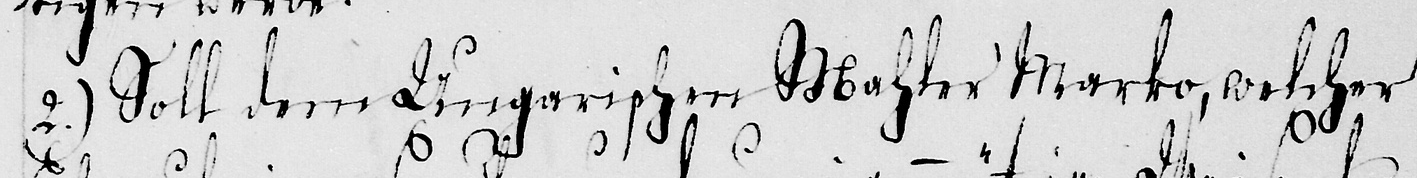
2.) Soll dem Ungarischen Mahler Marko, welcher
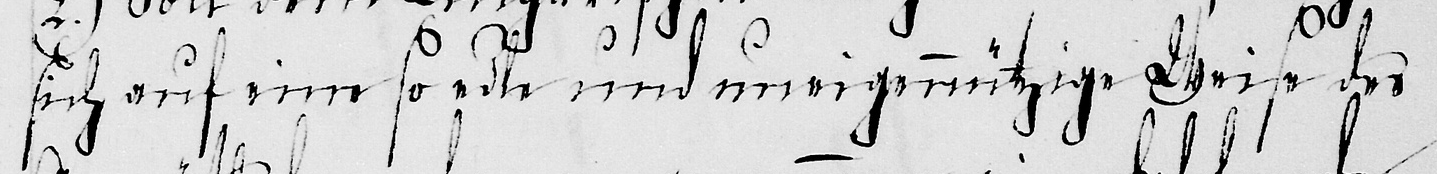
sich auf eine so edle und uneigennützige Weise des
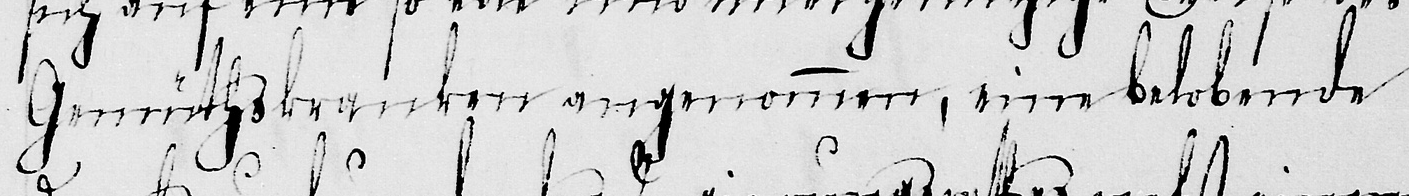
Gemüthskranken angenommen, eine belobende
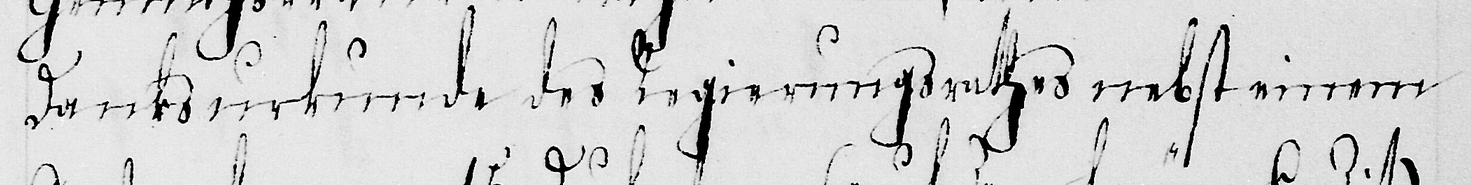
Danksurkunde des Regierungsrathes nebst einem
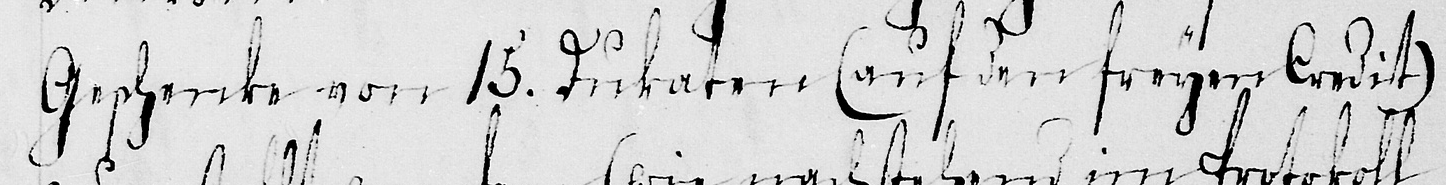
Geschenke von 15. Dukaten (auf den freyen Credit)
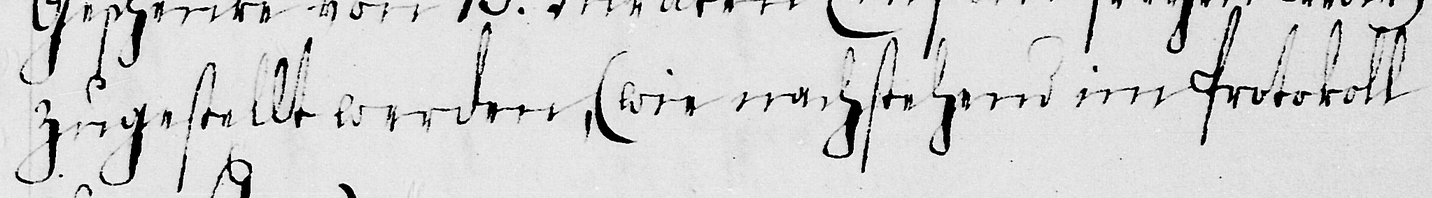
zugestellt werden, (wie nachstehend im Protokoll
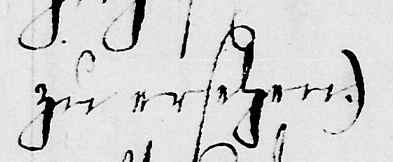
zu ersehen.)
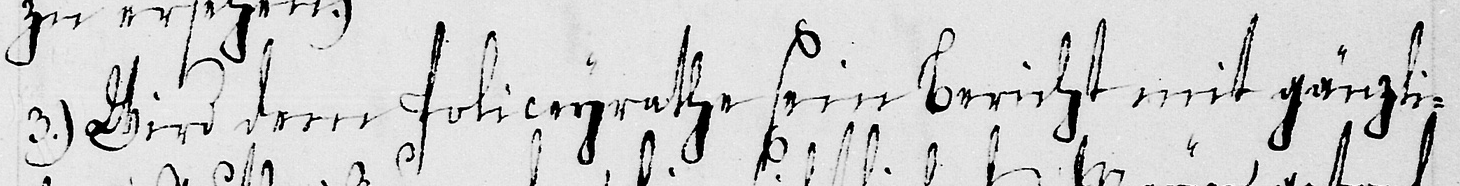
3.) Wird dem Policeyrathe sein Bericht mit gänzli¬
